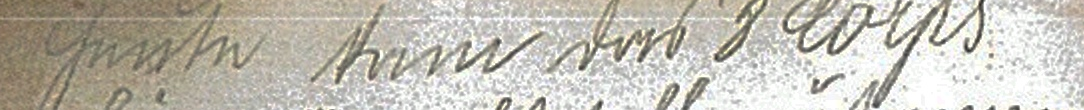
Heute kam das 8. Corps
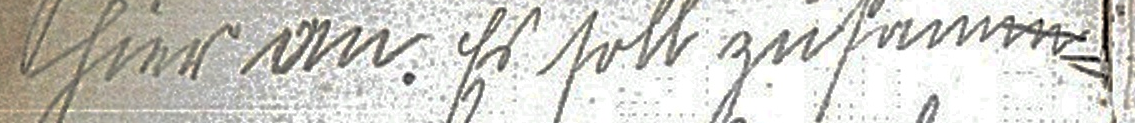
hier an. Es soll zusam-
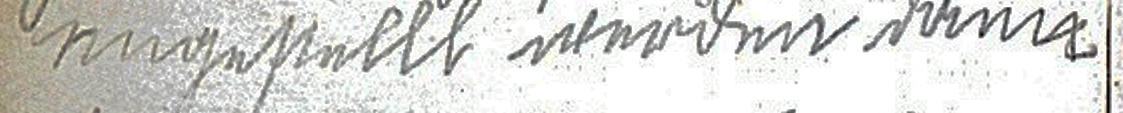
mengestellt werden dann
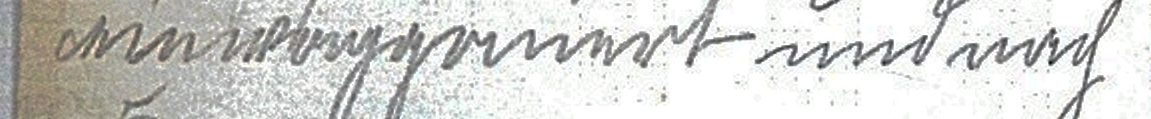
einwaggoniert und nach
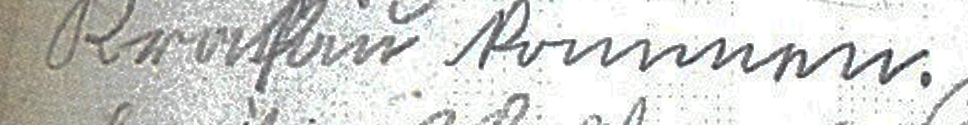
Krakau kommen.
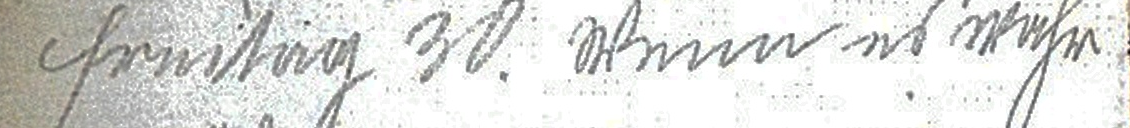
Freitag 30. Wenn es wahr
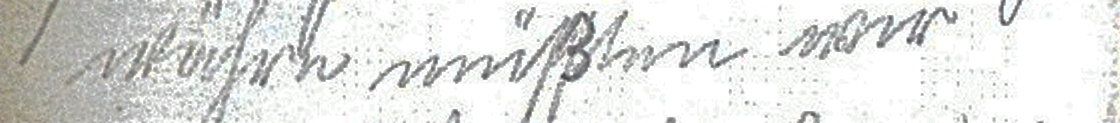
währe müßten wir
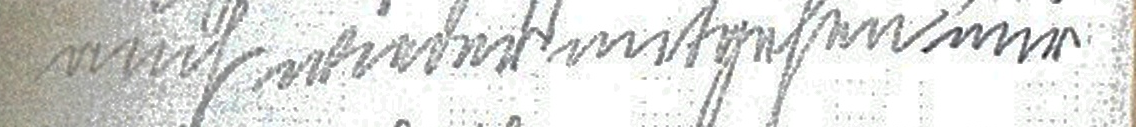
auch wieder mitgehen mir
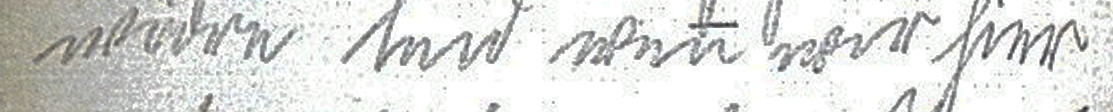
wäre leid wenn wir hier
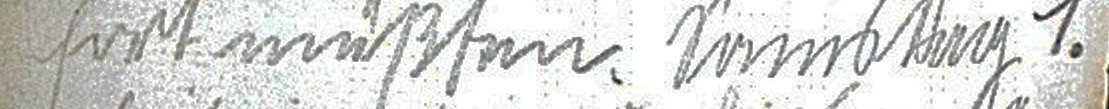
fort müßten. Samstag 1.
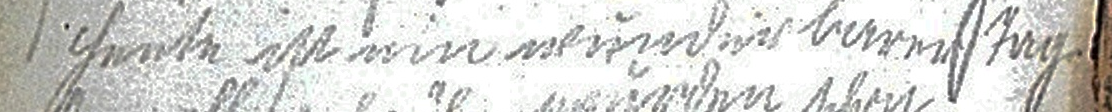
Heute ist ein wunderbarer Tag.
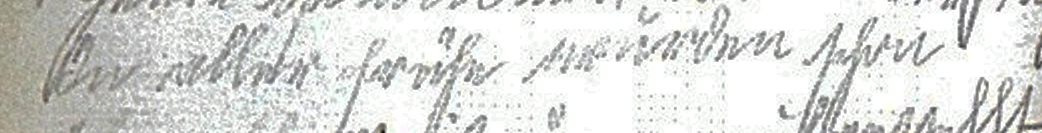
In aller Frühe wurden schon
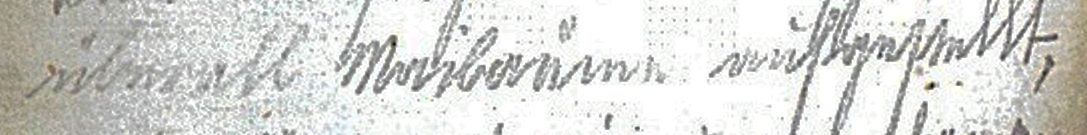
überall Maibäume aufgestellt,
